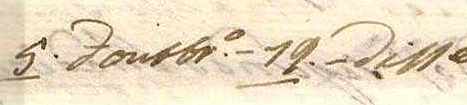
5. d̄outubr.o - 19.-disse
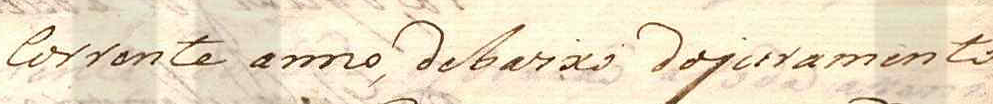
corrente anno, debaixo do juramento
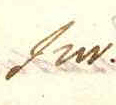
Iur.
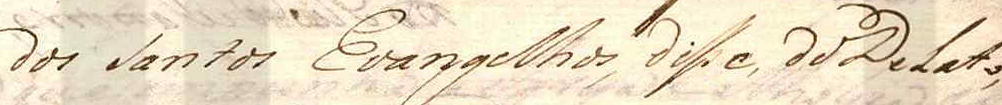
dos santos Evangelhos, disse, do Delato,
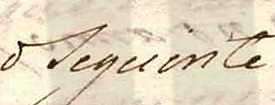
o seguinte
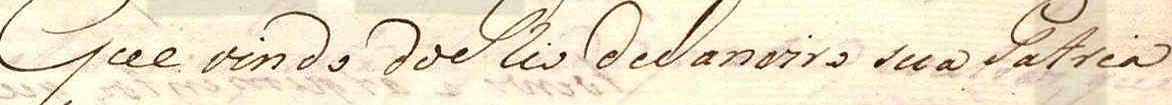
Que vindo do Rio de Ianeiro sua Patria
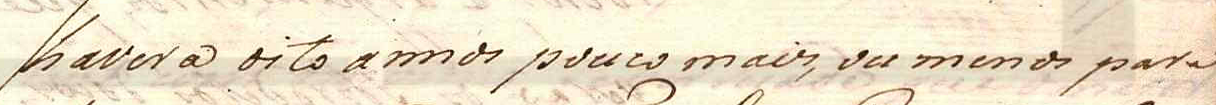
havera oito annos pouco mais, ou menos para
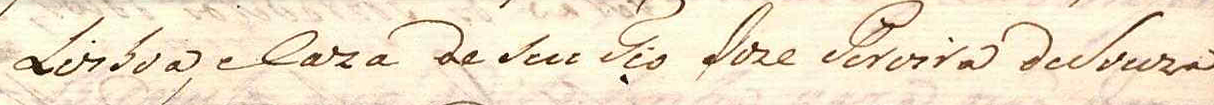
Lisboa, e Caza de seu Tio Ioze Pereira de Souza
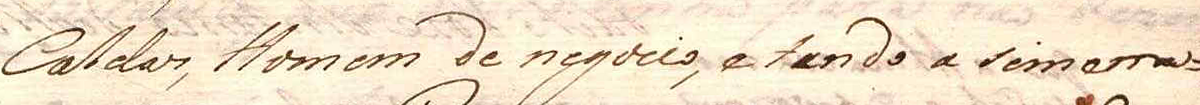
Caldas, Homem de negocio, e tendo asim ema
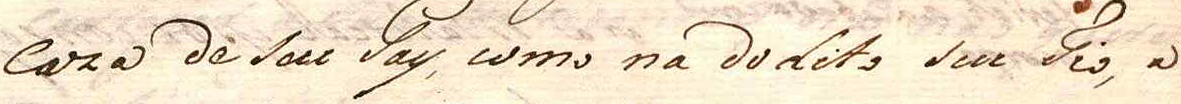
caza de seu Pay, como na do dito seu Tio, a
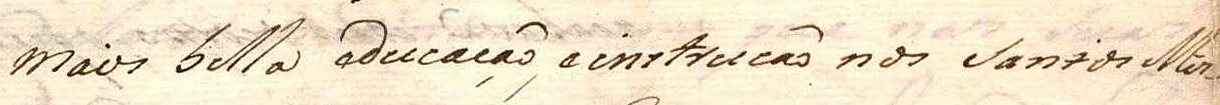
mais bella educaçaõ, e instrucão nos santos Miz
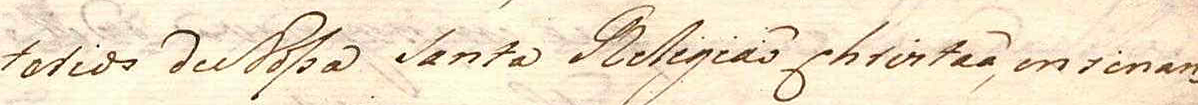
terios de Nossa santa Religiaõ Christaã, ensinan
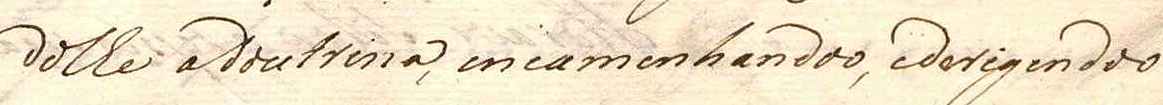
dolhe a doutrina, encamenhandoo, e derigendoo
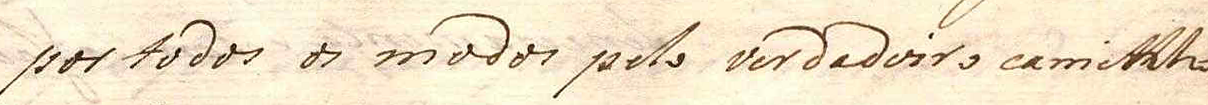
por todos os modos pelo verdadeiro caminho
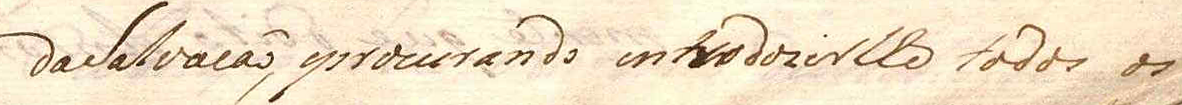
da Salvacaõ, e procurando entrodozirlhe todos os
